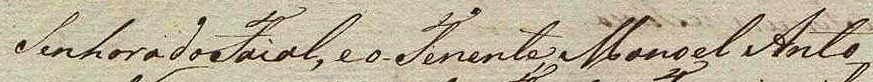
Senhora do Faial, e o Tenente Manoel Anto
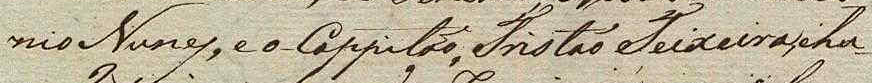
nio Nunes, e o Cappitaõ, Tristaõ Teixeira, e hu
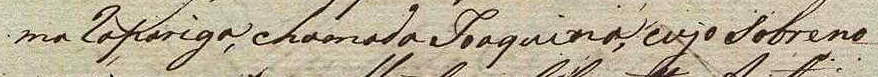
ma Rapariga, chamada Ioaquina, cujo sobreno
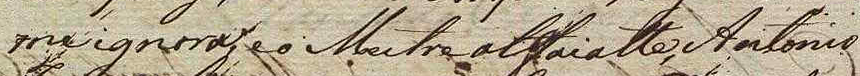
me ignora, e o Mestre alfaiatte, Antonio
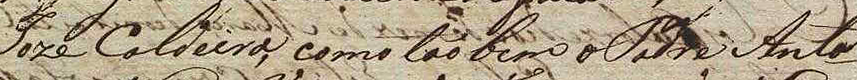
Ioze Caldeira, como taõbem o Padre Anto
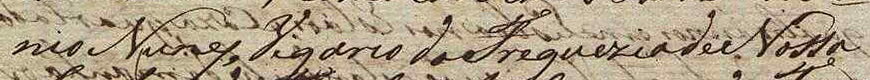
nio Nunes, Vigario da Freguezia de Nossa
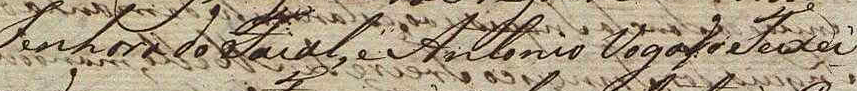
Senhora do Faial, e Antonio Vogado Teixei
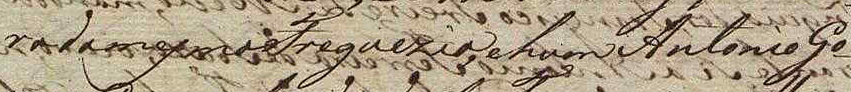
ra da mesma Freguezia, e hum Antonio Go
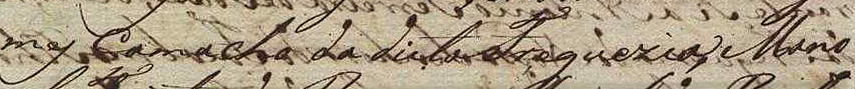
mes Camacho da dicta Freguezia, Mano
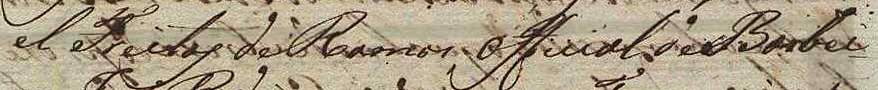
el Freitas de Ramos official de Barbei
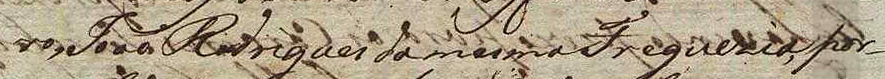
ro, Ioão Rodrigues da mesma Freguezia, por
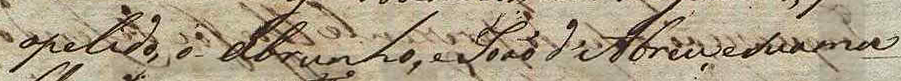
apelido, o abrunho, e Ioaõ d'Abreu, e sua mu
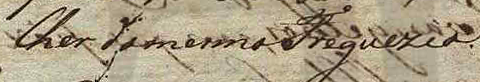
lher da mesma Freguezia.
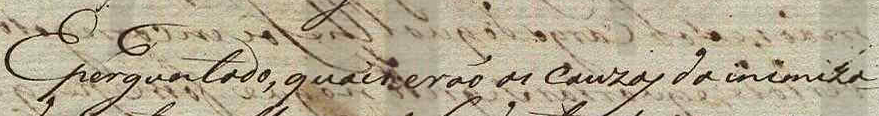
E perguntado, quais eraõ as cauzas da inimiza
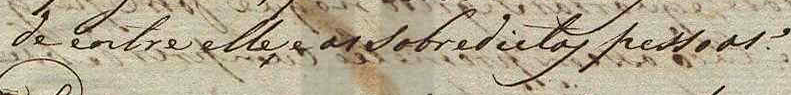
de entre elle, e as sobredictas pessoas.
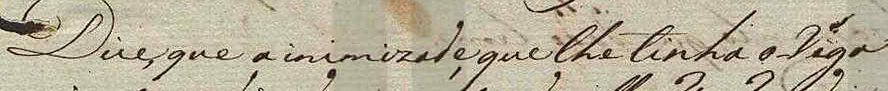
Dice, que a inimizade, que lhe tinha o Viga
